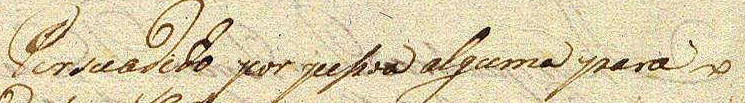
Persuadido por pessoa alguma para o
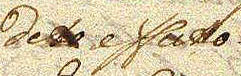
dito effeito.
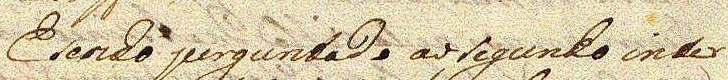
E sendo perguntado ao segundo inter
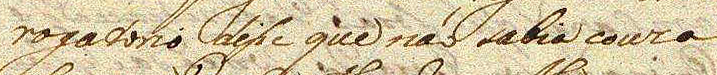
rogatorio disse que não sabia couza
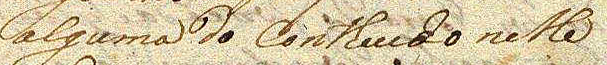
alguma do contheudo nelle
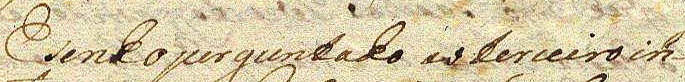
E sendo perguntado ao terceiro in
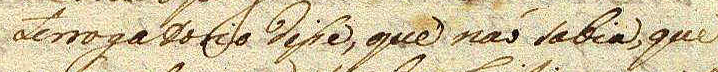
terrogatorio disse, que não sabia, que
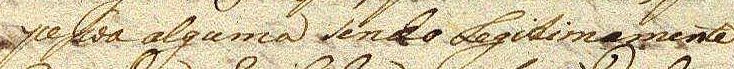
pessoa alguma sendo Legitimamente
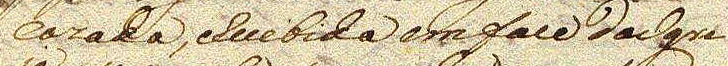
cazada, e Recebida em face da Igre
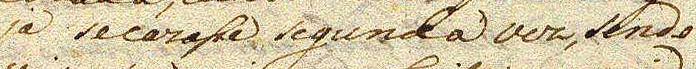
ja se cazasse segunda vez, sendo
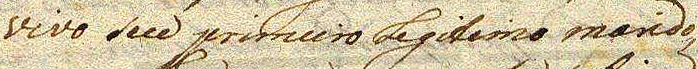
vivo seu primeiro Legitimo marido,
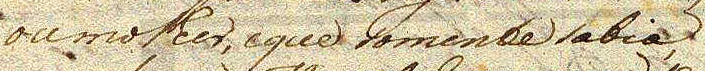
ou molher, e que somente sabia
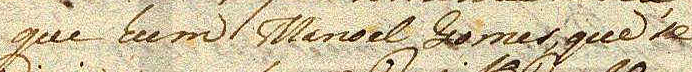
que hum Manoel Gomes, que se
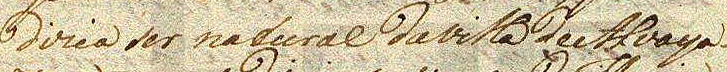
dizia ser natural da villa de Alvaya
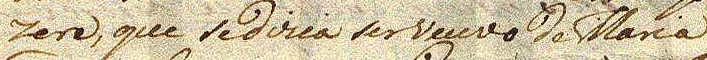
zere, que se dizia ser veuvo de Maria
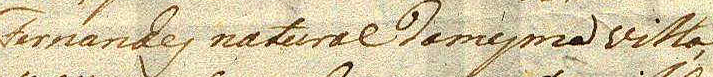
Fernandes natural da mesma villa,
